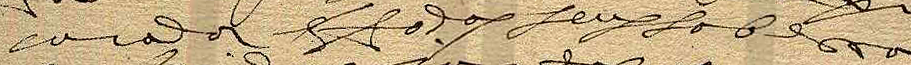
curador e todos seus sobesta
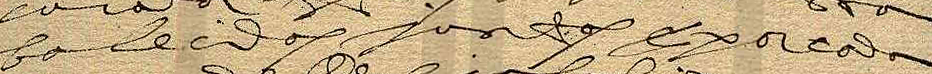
belecidos juntos e por cada
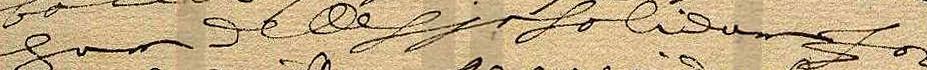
hum delles jn solidum for
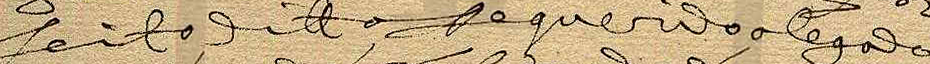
feito, ditto, requerido, alegado
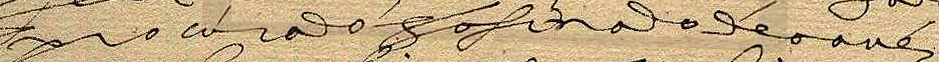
procurado e asinado de o aver
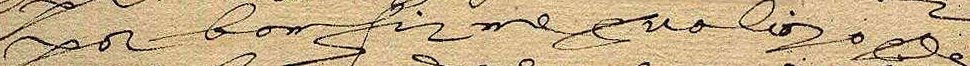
por bom firme e valiozo e de
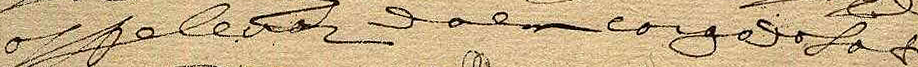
os relevar do em cargo da satis
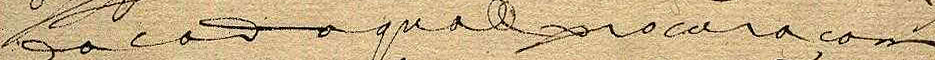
facaõ a quall procuraçam
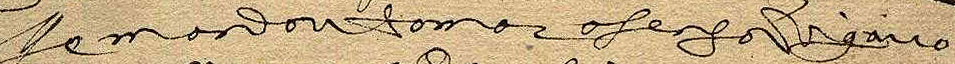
lhe mandou tomar o Senhor Vigario
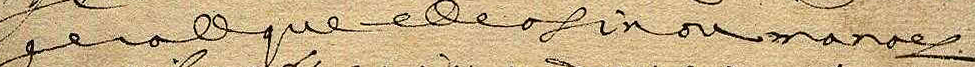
gerall que elle asinou manoel
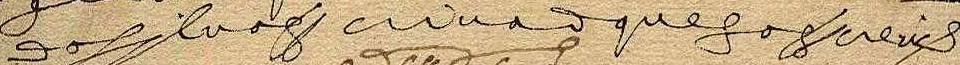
da Silva o escrivaõ que ho escrevi
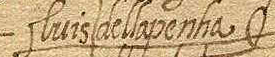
luis della penha
